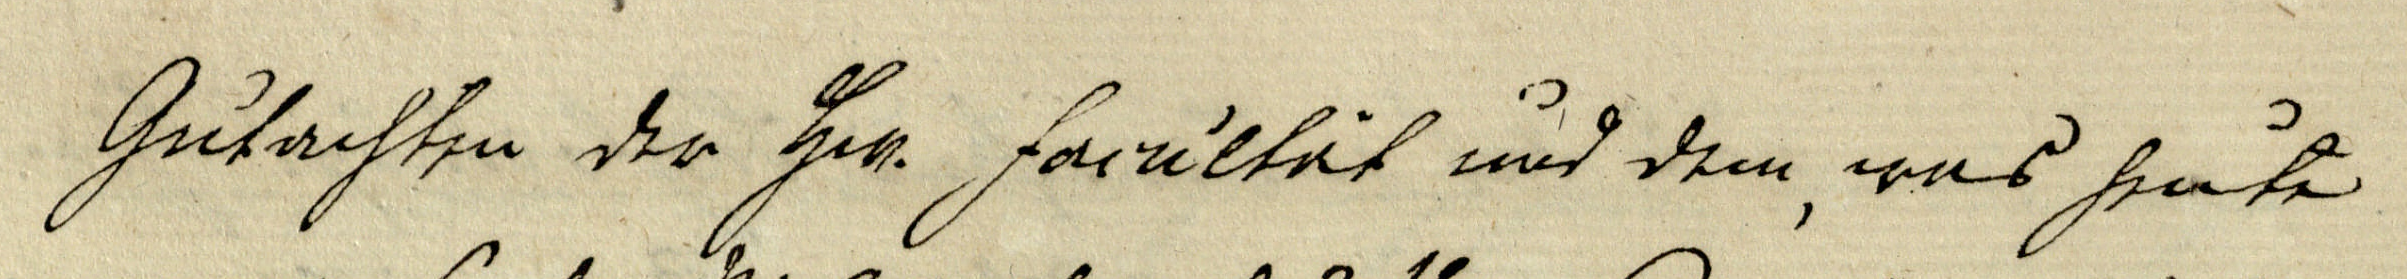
Gutachten der Hw. Facultät und dem, was heute
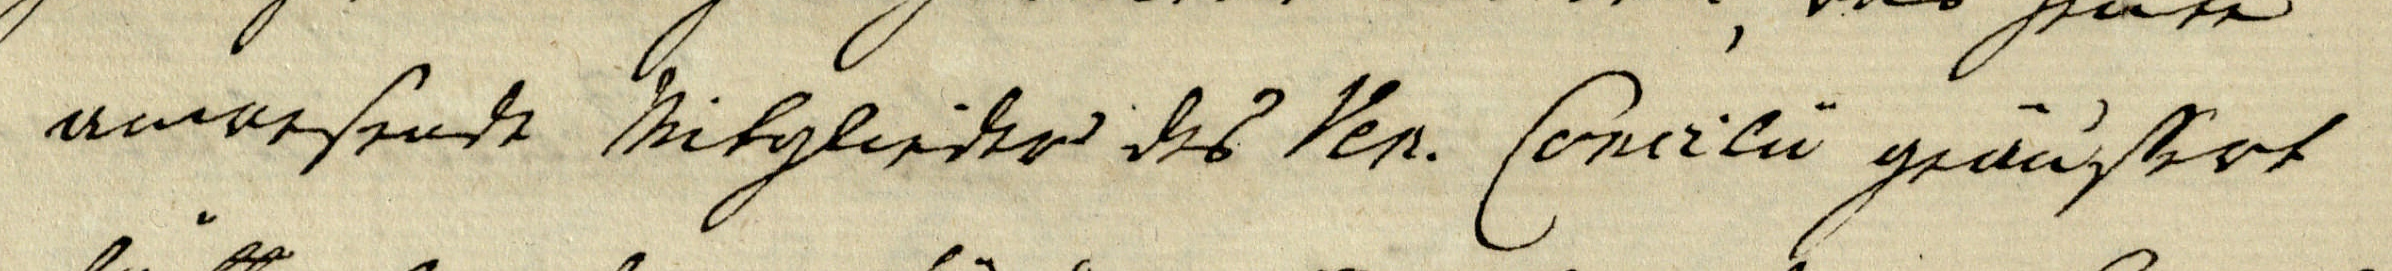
anwesende Mitglieder des Ven. Concilii geäussert
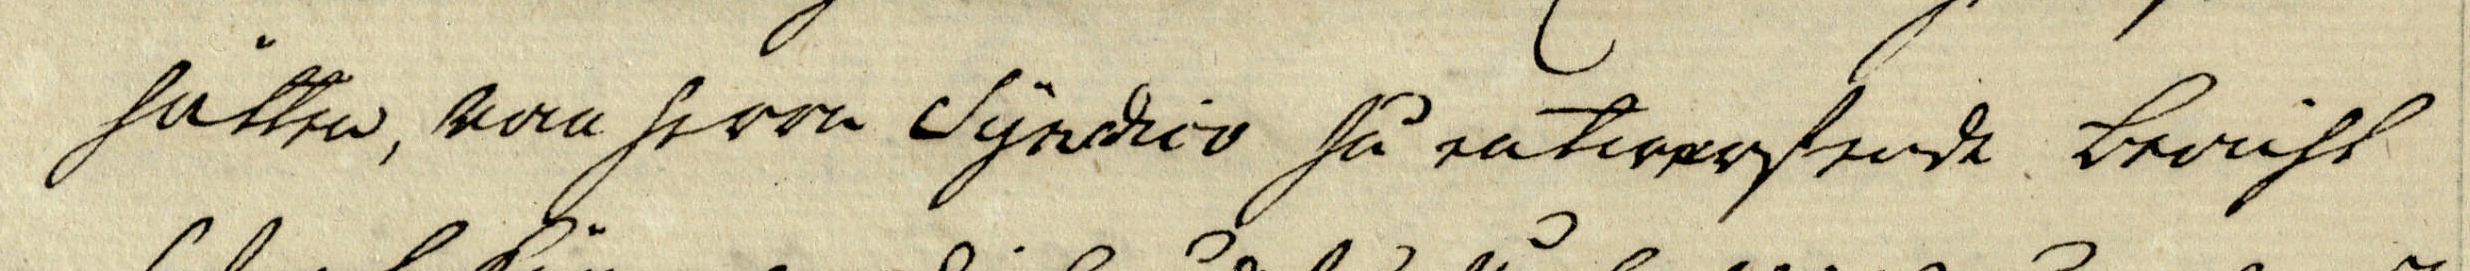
hätten, vom Herrn Sÿndico zu entwerfende Bericht
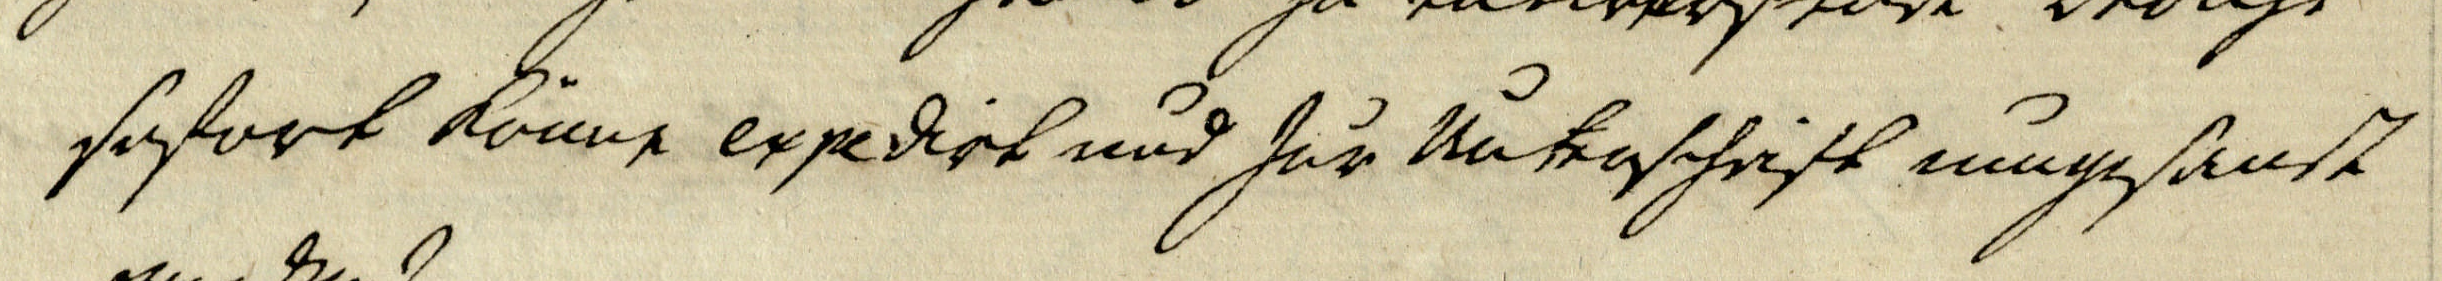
sofort könne expedirt und zur Unterschrift eingesandt
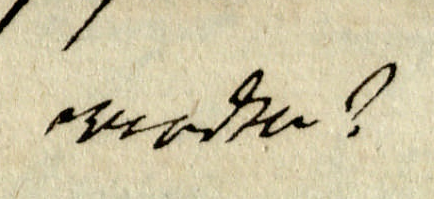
werden?
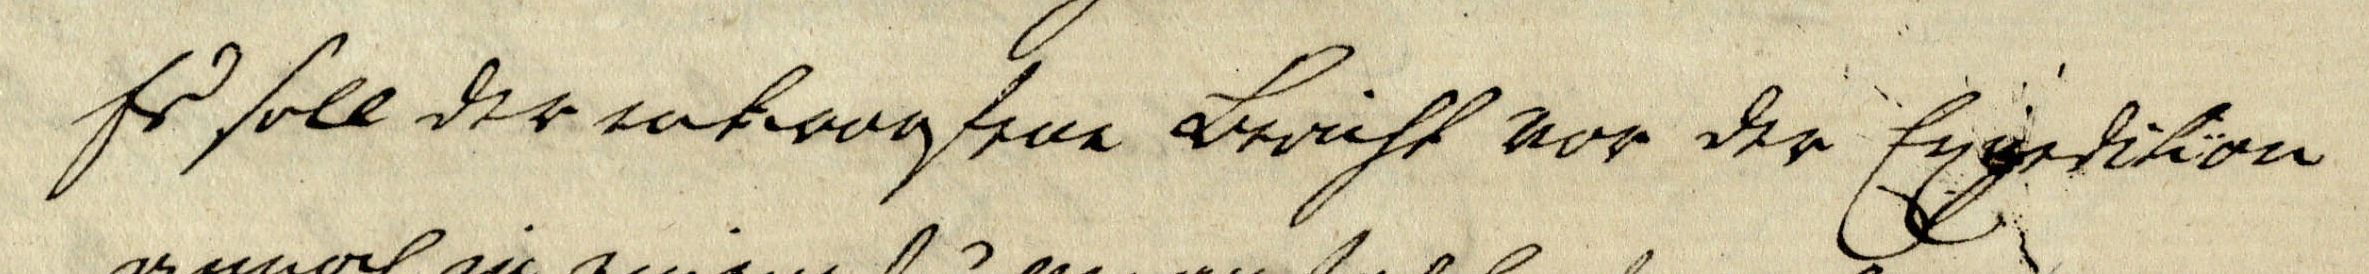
Es soll der entworfene Bericht vor der Expedition
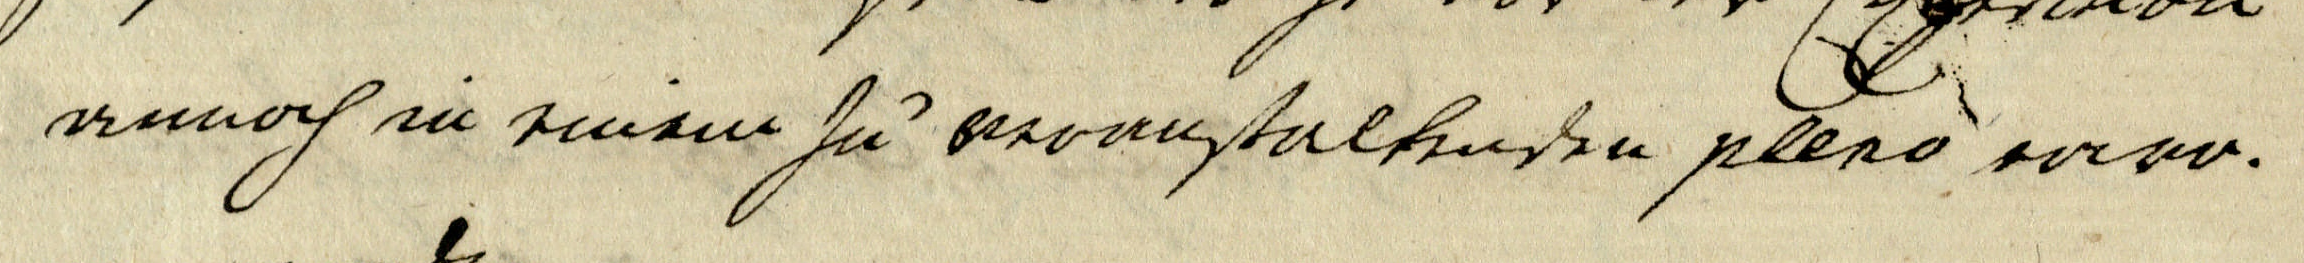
annoch in einem zu veranstaltenden pleno erwo¬
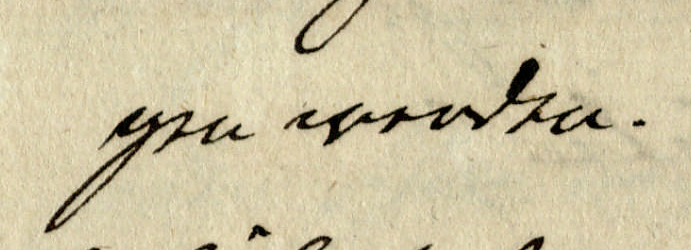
gen werden.
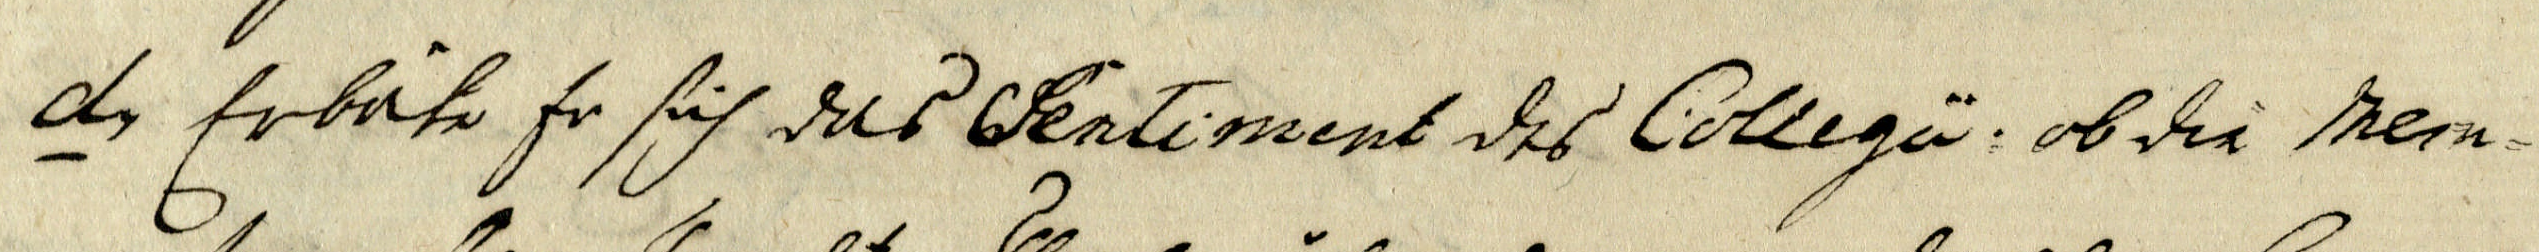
d. Erbäte Er sich das Sentiment des Collegii: ob die Mem¬
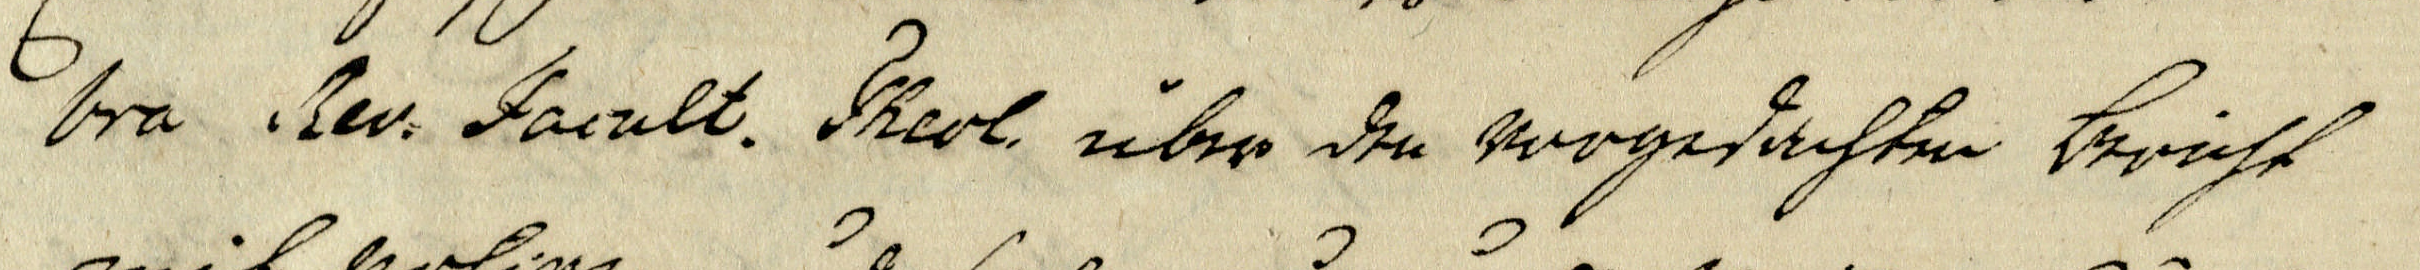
bra Rer. Facult. Theol. über den vorgedachten Bericht
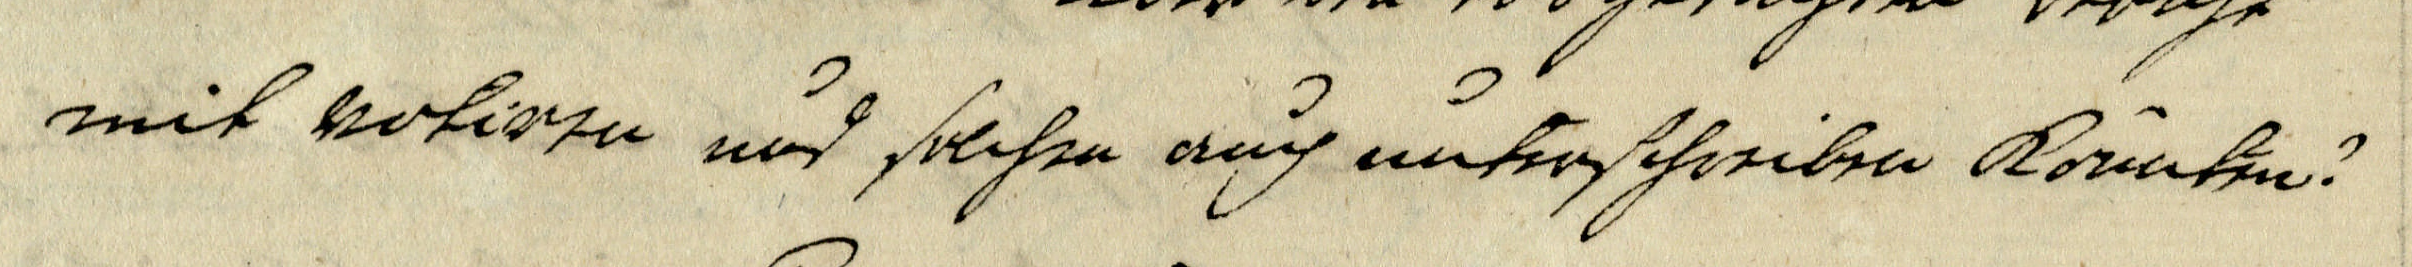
mit votiren und solchen auch unterschreiben könnten?
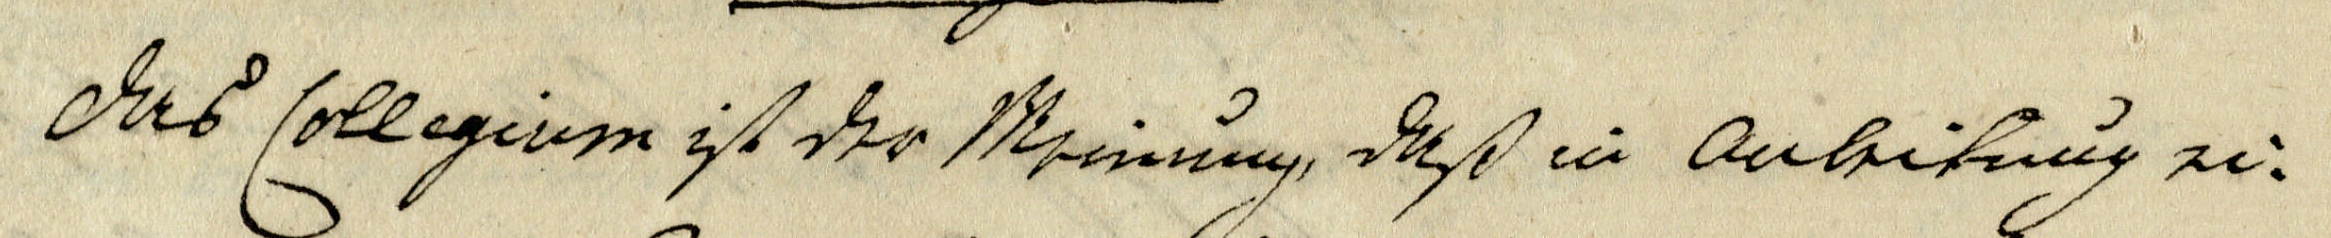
Das Collegium ist der Meinung, daß in Anleitung ei¬
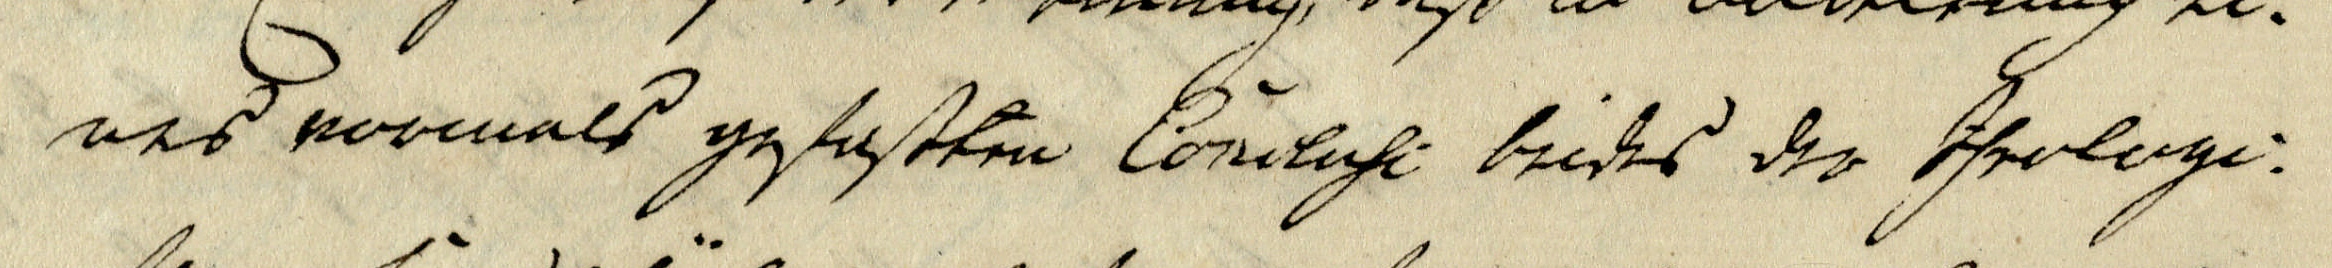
nes vormals gefaßten Conclusi beides der Theologi¬
